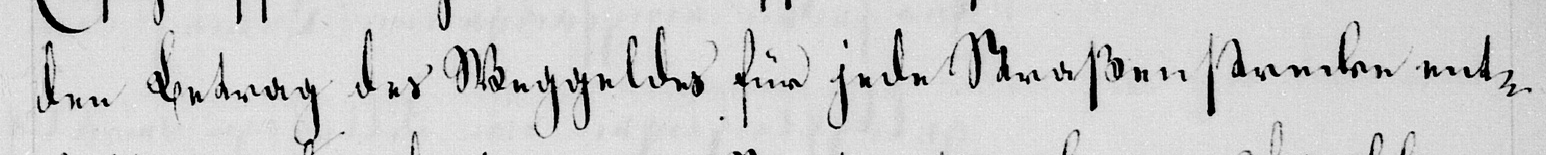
den Betrag des Weggeldes für jede Straßenstrecke ent¬
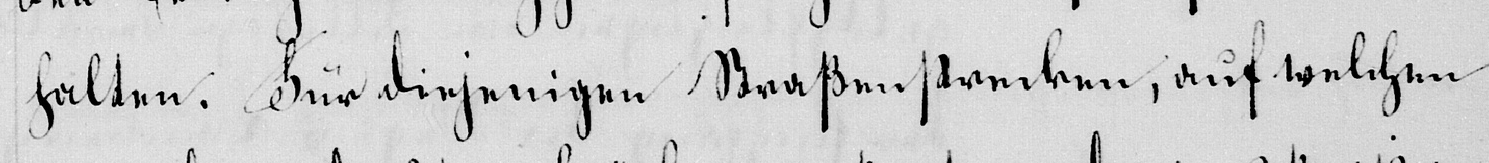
halten. Für diejenigen Straßenstrecken, auf welchen
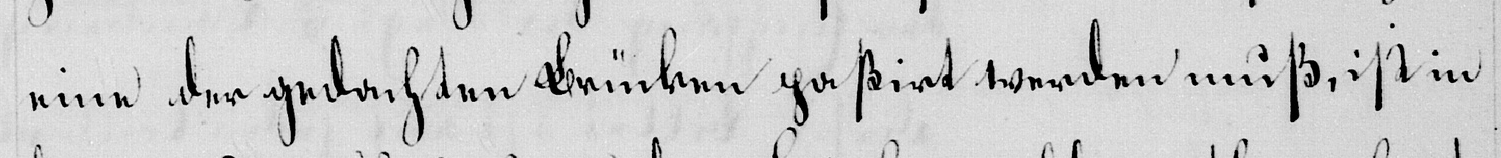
eine der gedachten Brücken paßirt werden muß, ist in
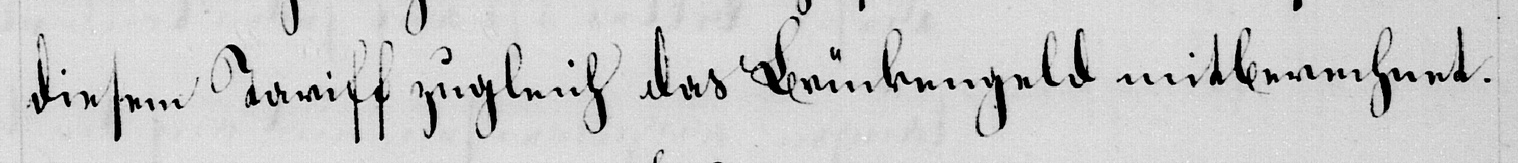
diesem Tariff zugleich das Brückengeld mitberechnet.
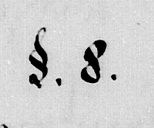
§. 8.
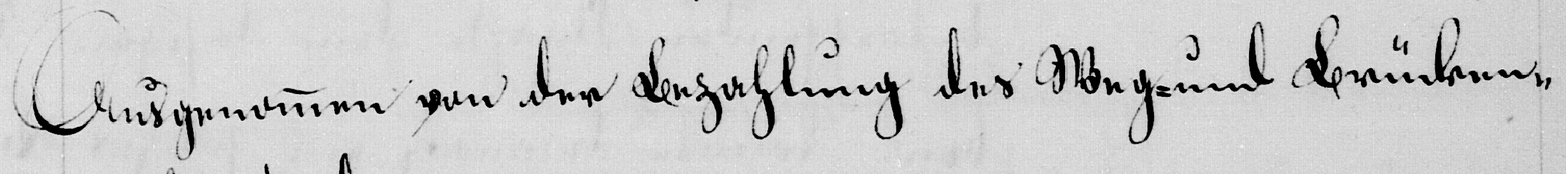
Ausgenommen von der Bezahlung des Weg- und Brücken¬
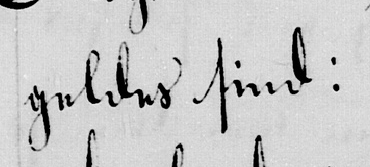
geldes sind:
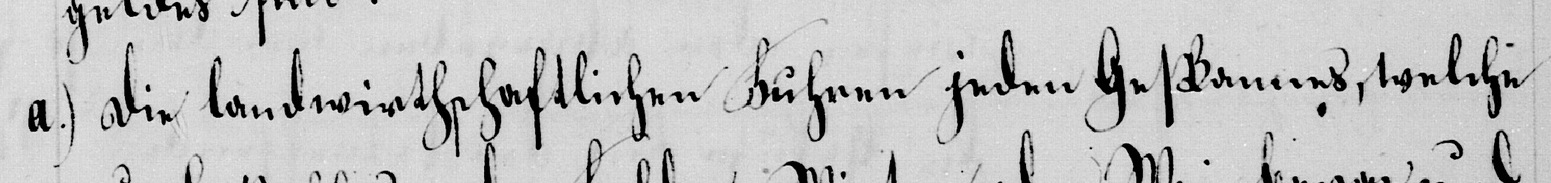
a.) Die landwirthschaftlichen Fuhren jeden Gespannes, welche
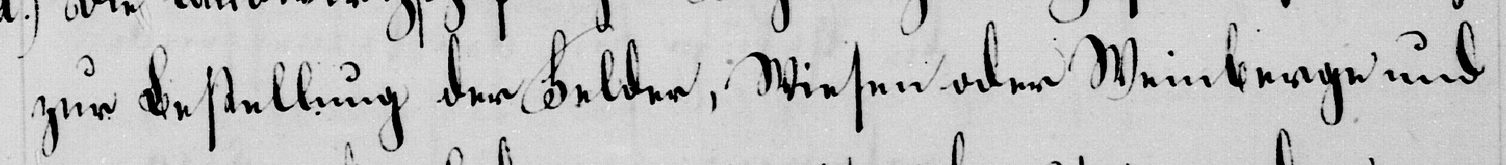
zur Bestellung der Felder, Wiesen oder Weinberge und
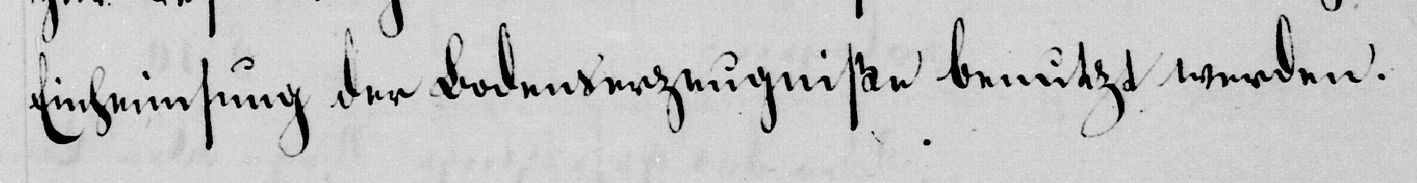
Einheimsung der Bodenserzeugniße benutzt werden.
